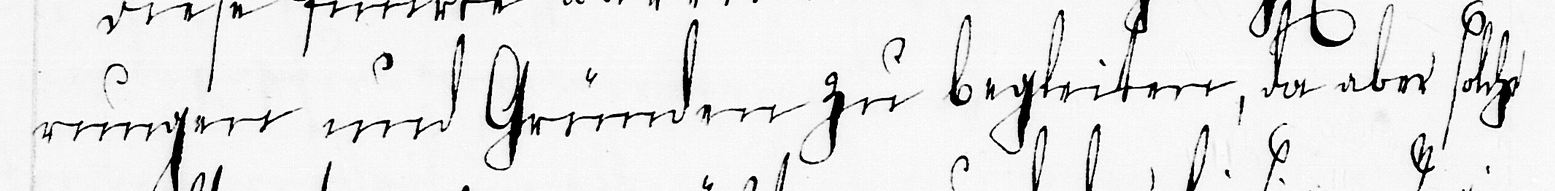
rungen und Gründen zu begleiten, da aber solche
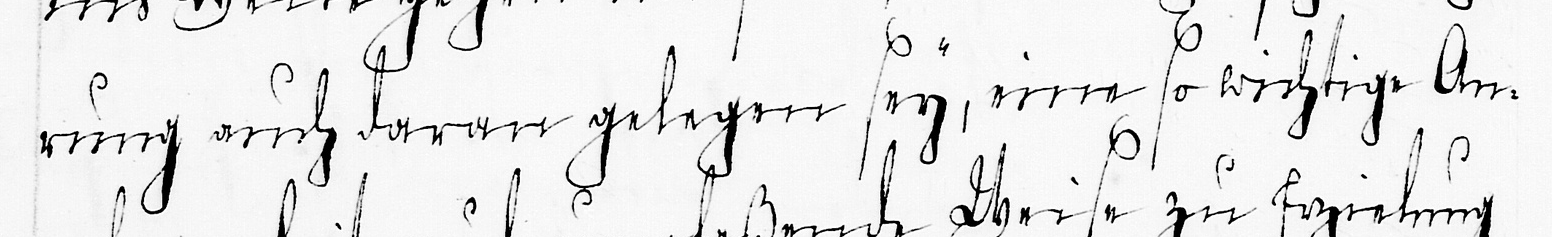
rung auch daran gelegen sey, eine so wichtige An¬
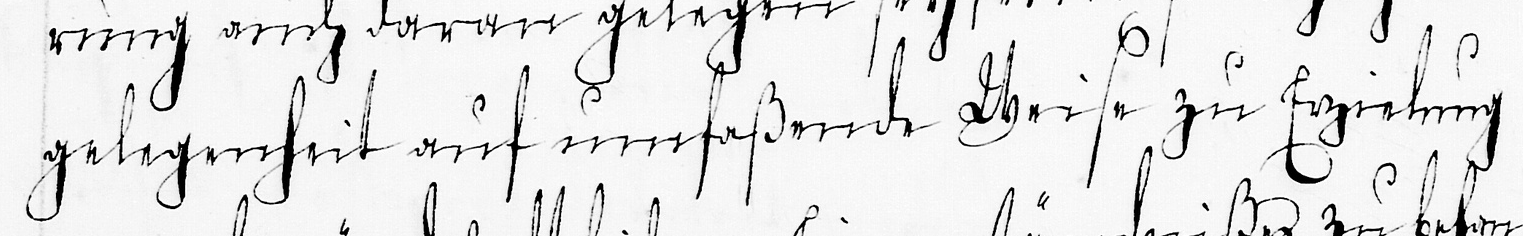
gelegenheit auf umfaßende Weise zu Erzielung
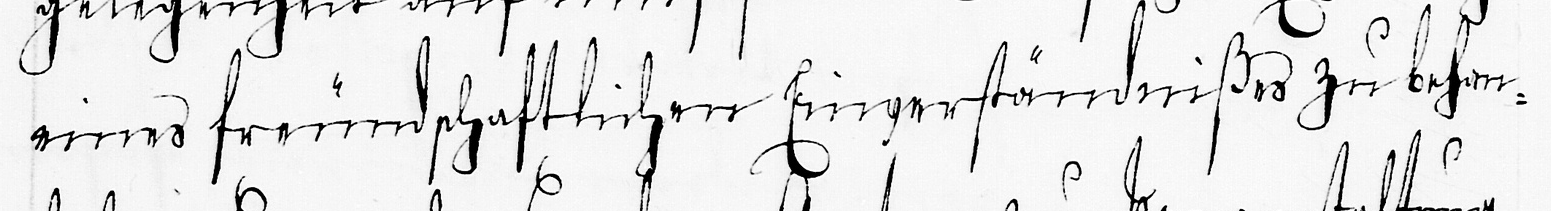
eines freundschaftlichen Einverständnißes zu behan¬
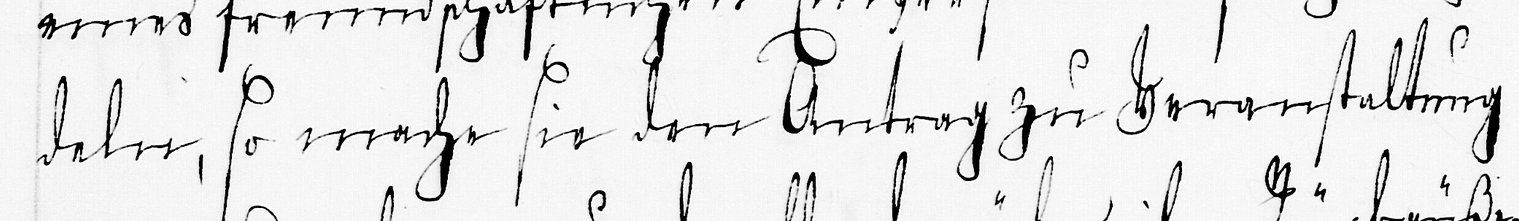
deln, so mache sie den Antrag zu Veranstaltung
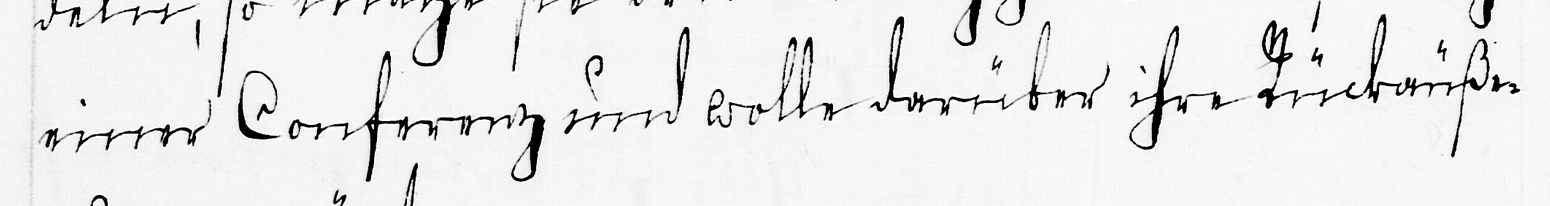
einer Conferenz und wolle darüber ihre Rückäuße¬
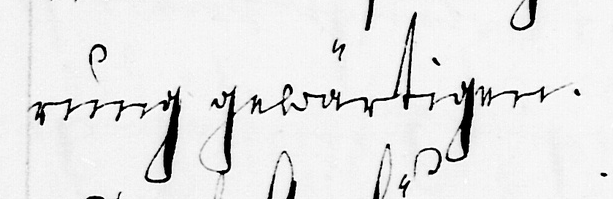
rung gewärtigen.
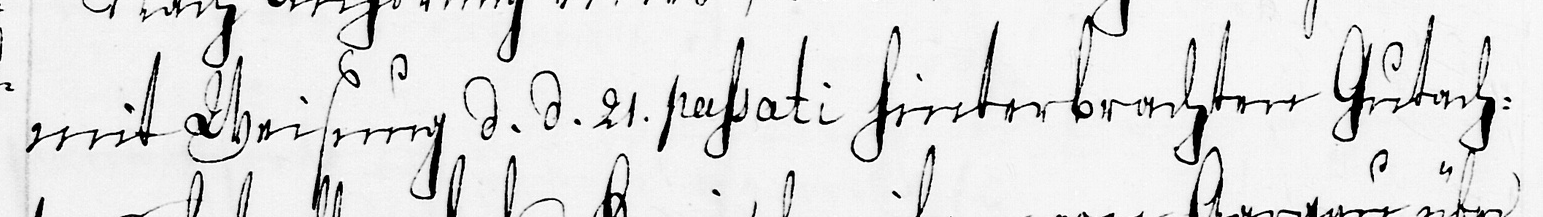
mit Weisung d. d. 21. paßati hinterbrachten Gutacht¬
